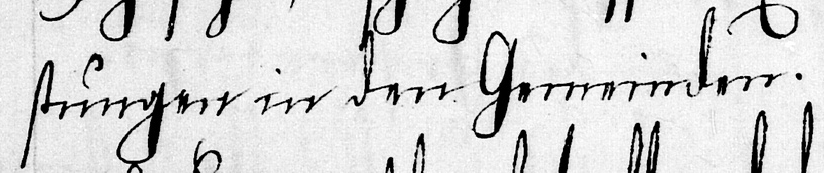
stungen in den Gemeinden.
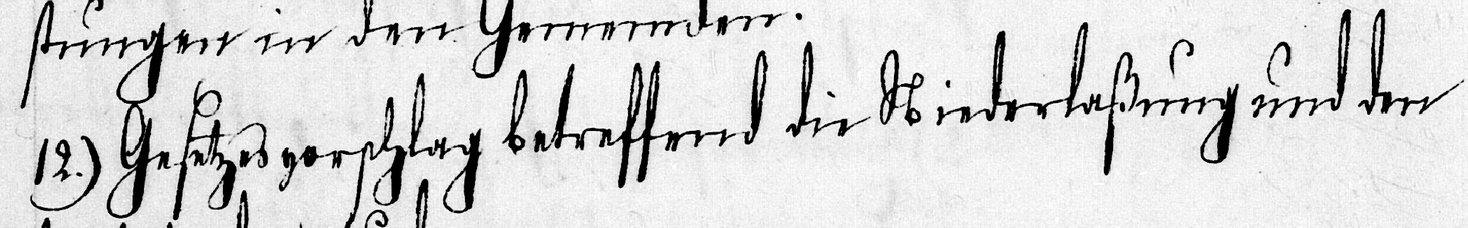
Gesetzesvorschlag betreffend die Niederlaßung und den
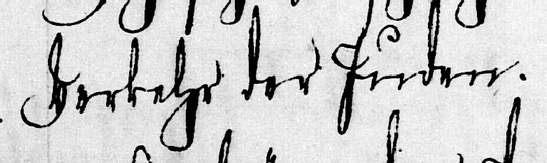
Verkehr der Juden.
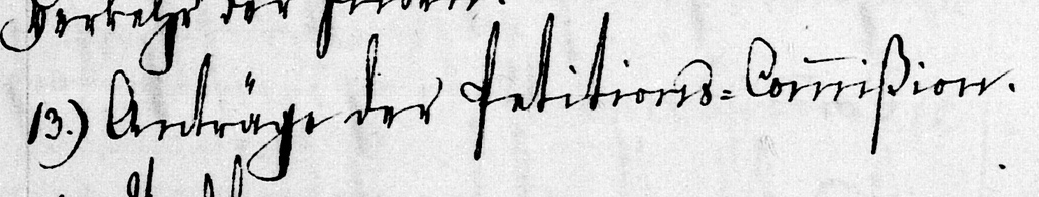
13.) Anträge der Petitions-Commißion.
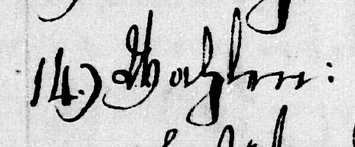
14.) Wahlen:
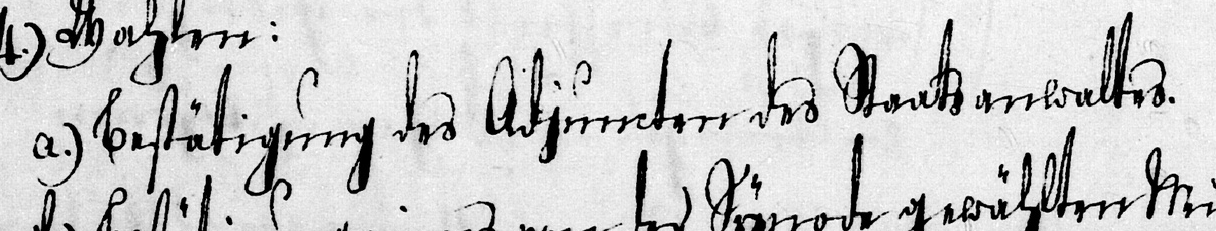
a.) Bestätigung des Adjuncten des Staatsanwaltes.
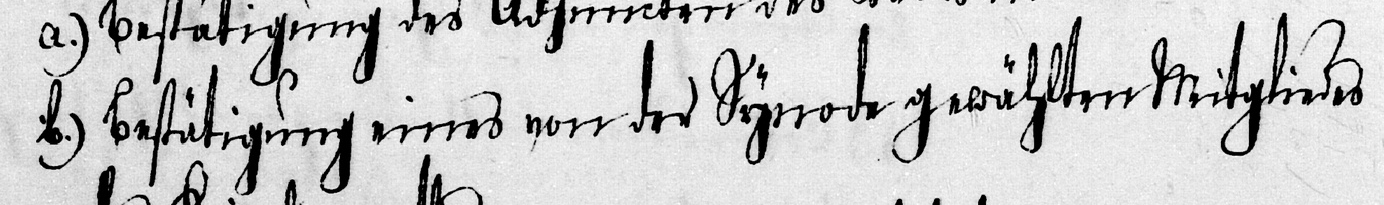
b.) Bestätigung eines von der Synode gewählten Mitgliedes
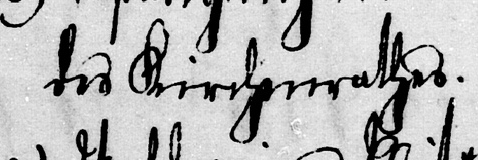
des Kirchenrathes.
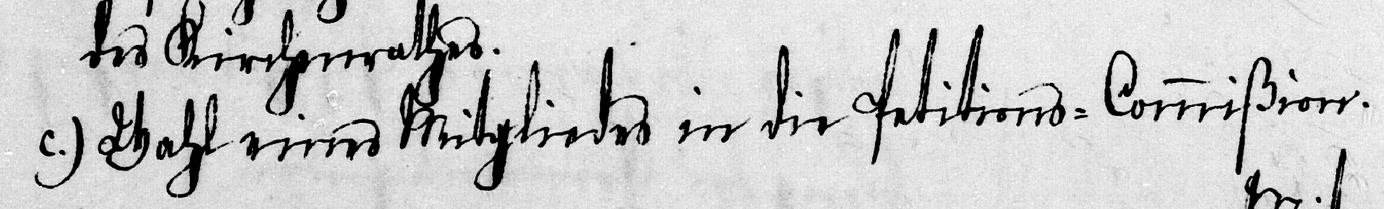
c.) Wahl eines Mitgliedes in die Petitions-Commißion.
